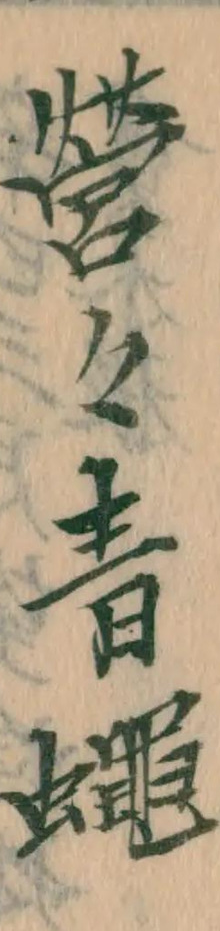營々青蝿
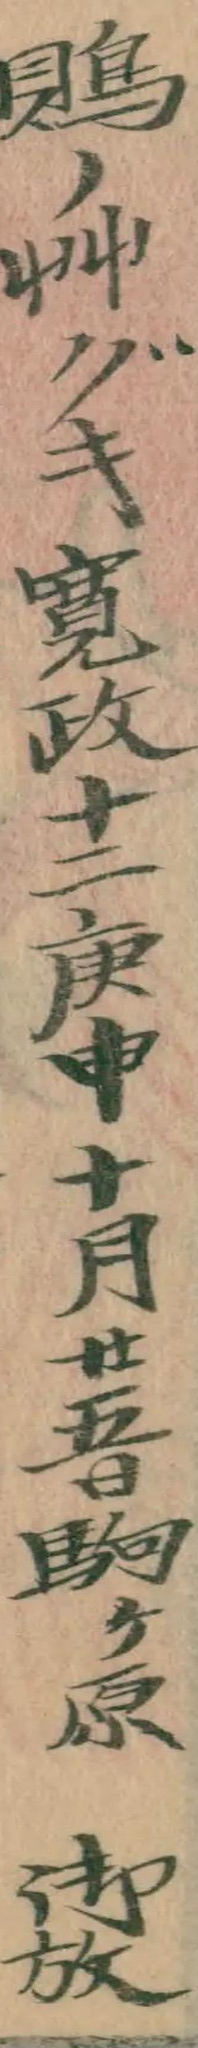鵙ノ艸グキ寛政十二庚申十月廿五日駒ヶ原御放
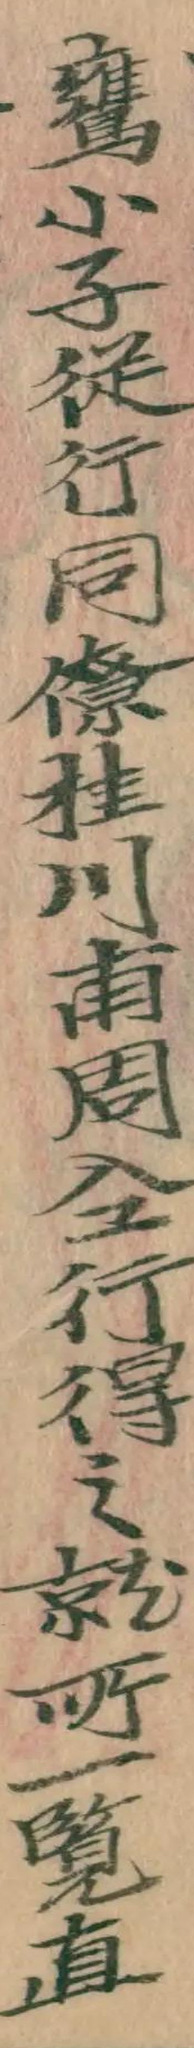鷹小子従行同僚桂川甫周仝行得之就所一覧直
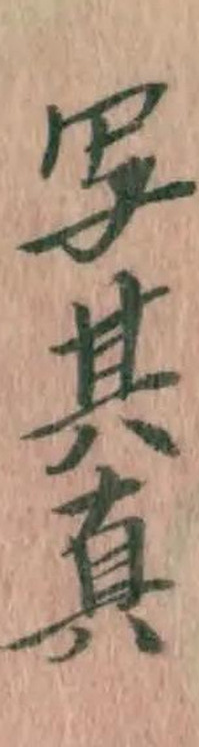写其真
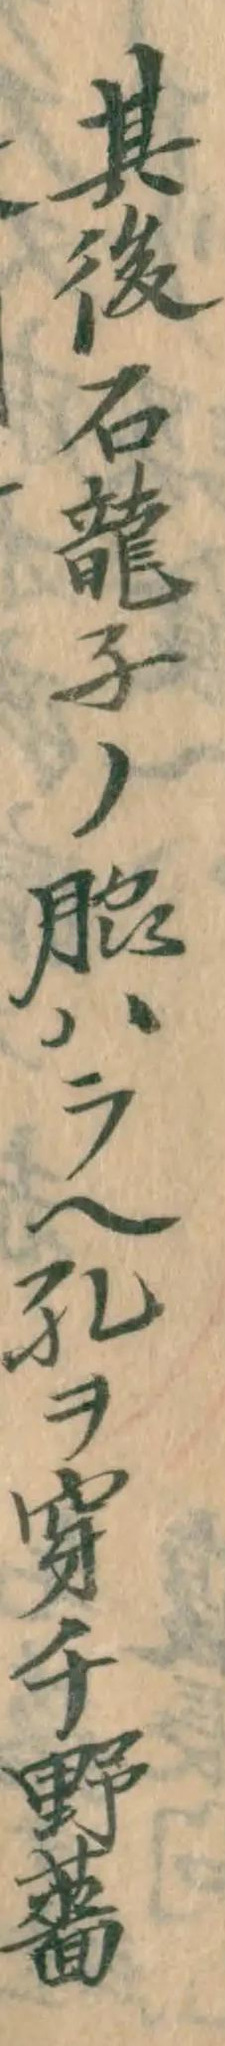其後石龍子ノ脇ハラヘ孔ヲ穿チ野薔
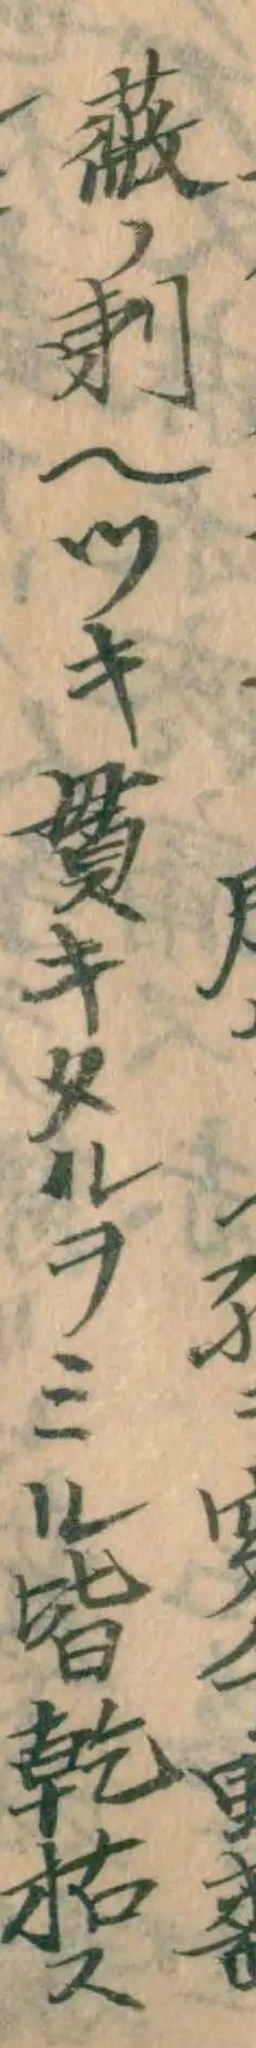薇ノ刺ヘツキ貫キタルヲミル皆乾枯ス
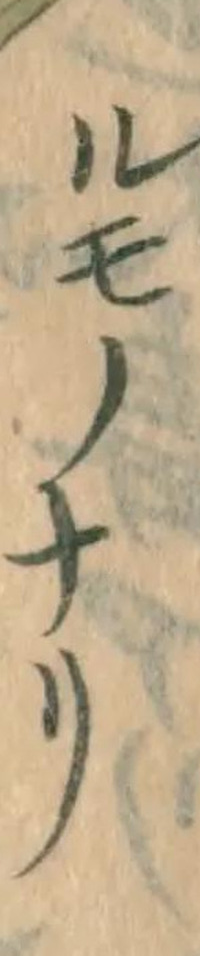ルモノナリ

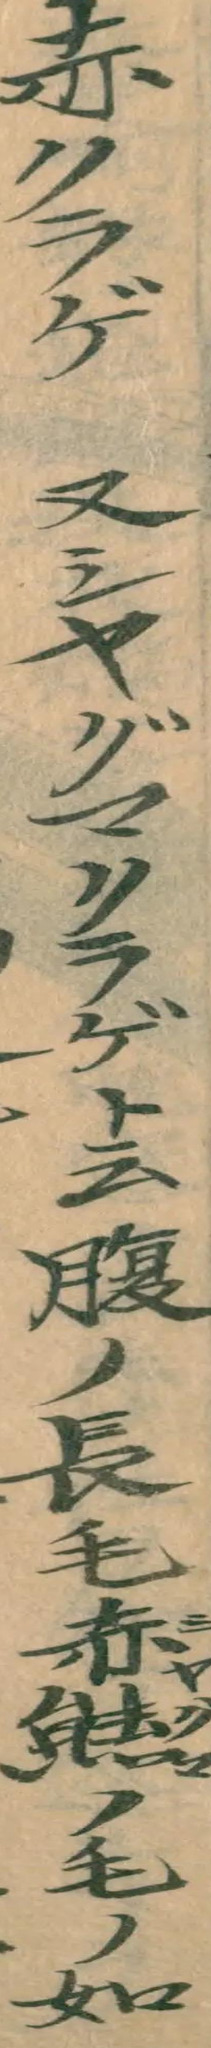赤クラゲ又シヤグマクラゲト云腹ノ長毛赤熊ノ毛ノ如
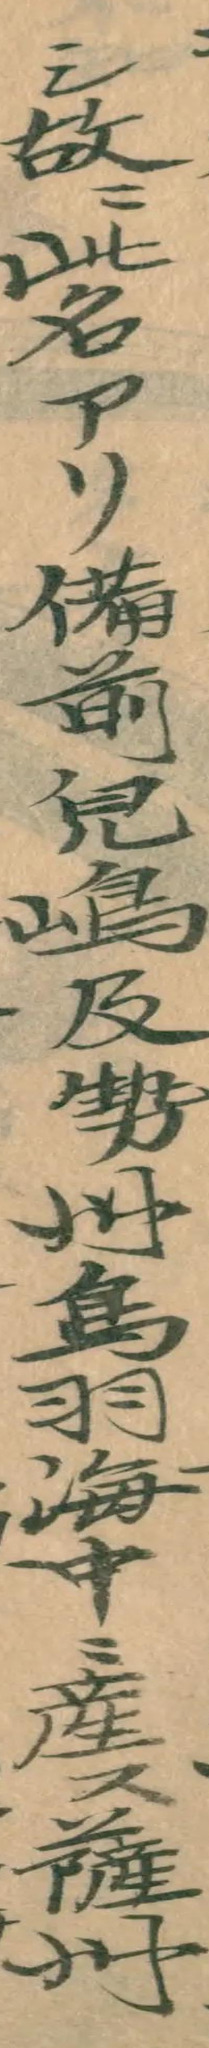シ故ニ此名アリ備前兒嶋及勢州鳥羽海中ニ産ス薩州
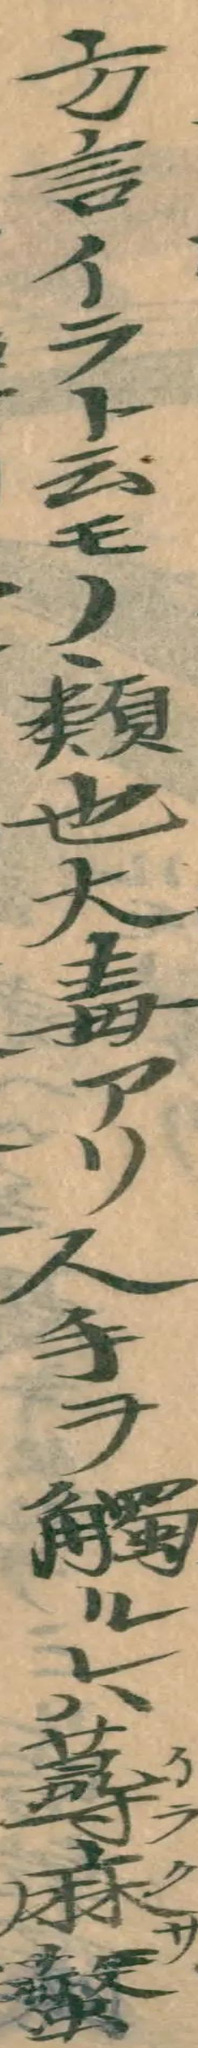方言イラト云モノヽ類也大毒アリ人手ヲ觸ルレハ蕁麻螫
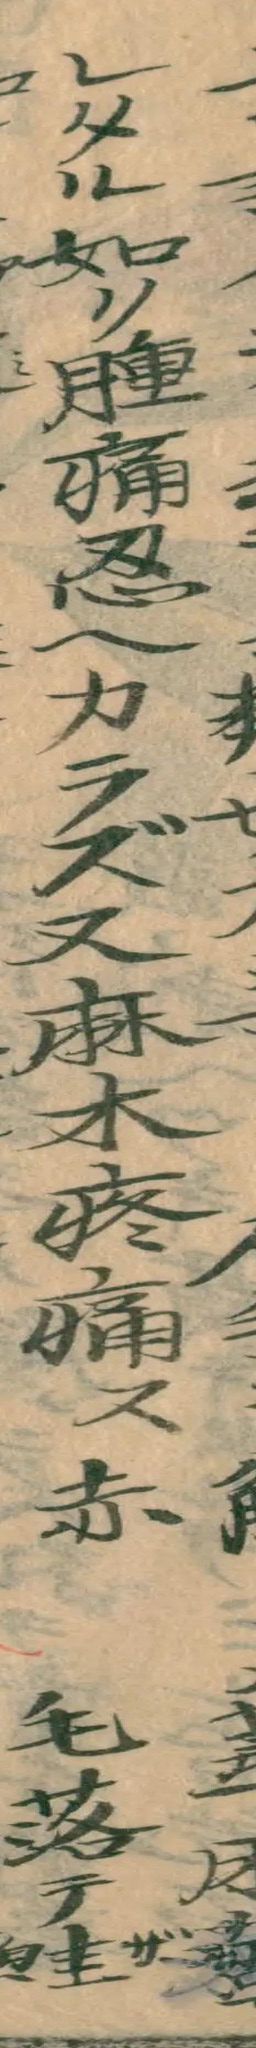レタル如ク腫痛忍ヘカラズ又麻木疼痛ス赤毛落テ鮭
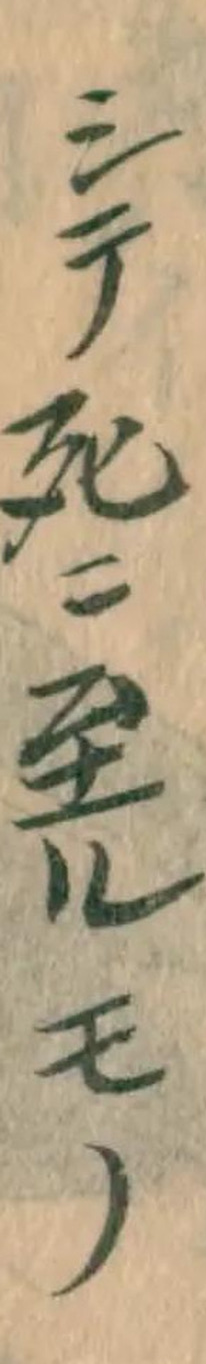シテ死ニ至ルモノ
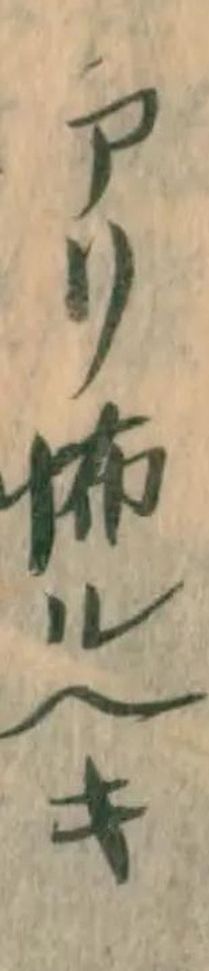アリ怖ルヘキ
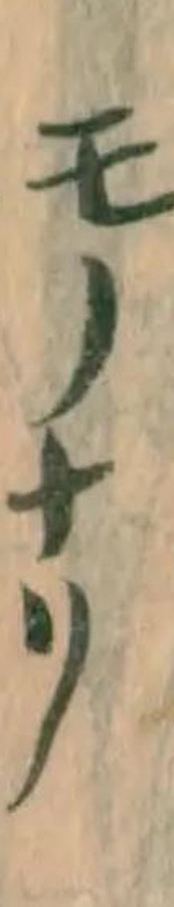モノナリ
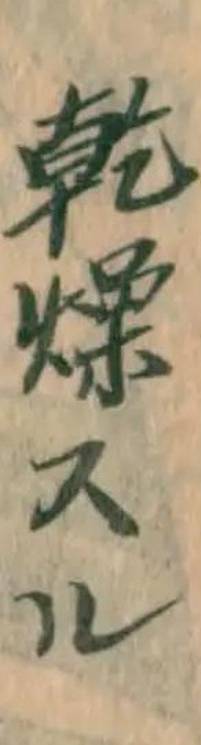乾燥スル
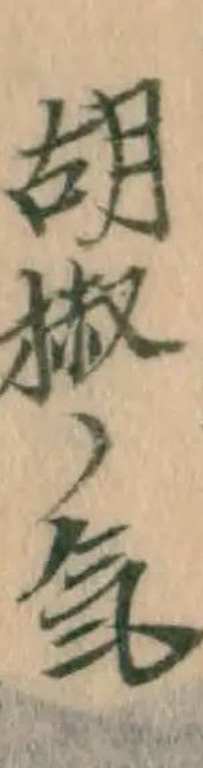胡椒ノ気
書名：千蟲譜 3巻. [2]
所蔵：国立国会図書館 National Diet Library, JAPAN
